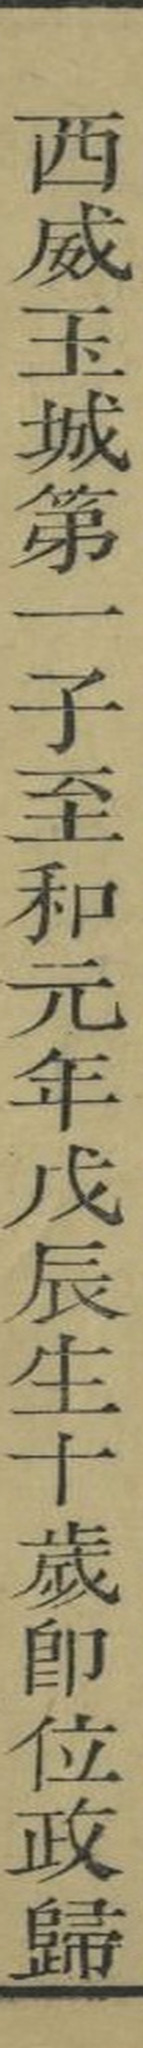西威玉城第一子至和元年戊辰生十歳即位政帰
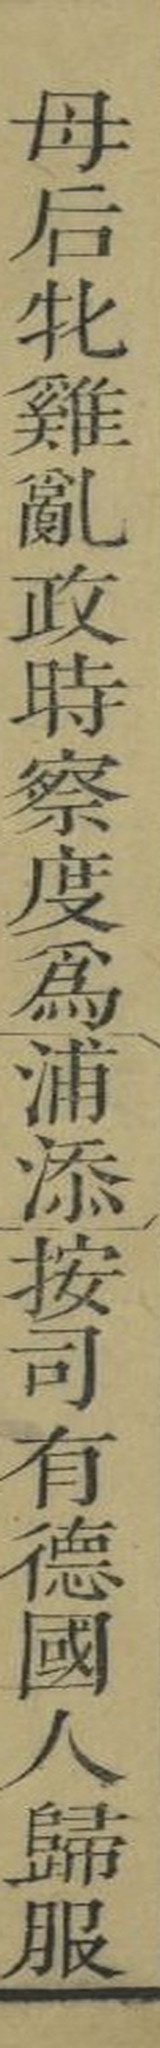母后牝鶏乱政時察度為[浦添]按司有徳国人帰服
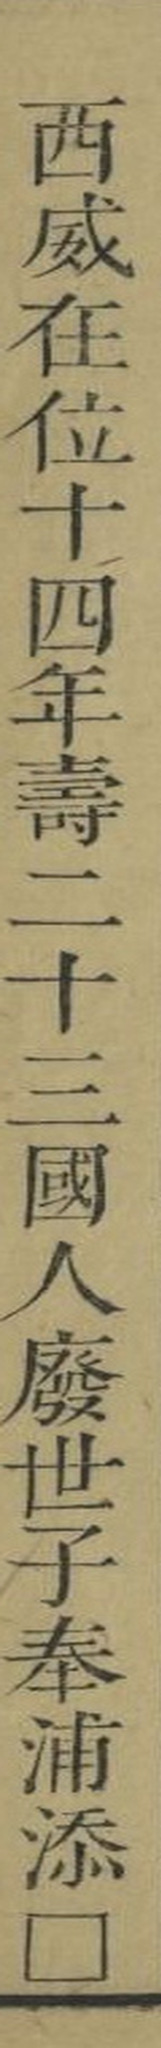西威在位十四年寿二十三国人廃世子奉浦添▢

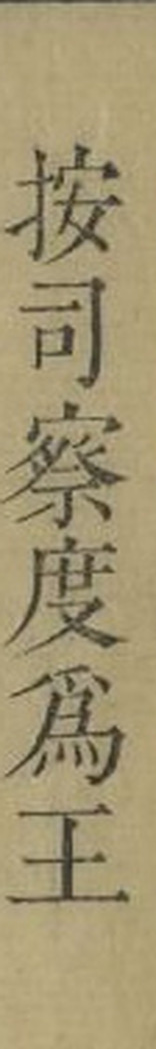按司察度為王
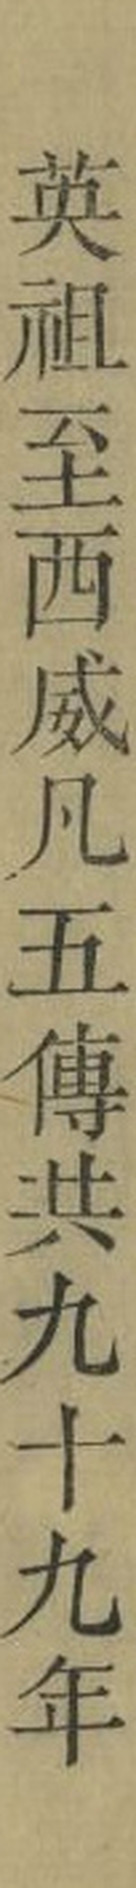英祖至西威凡五伝共九十九年
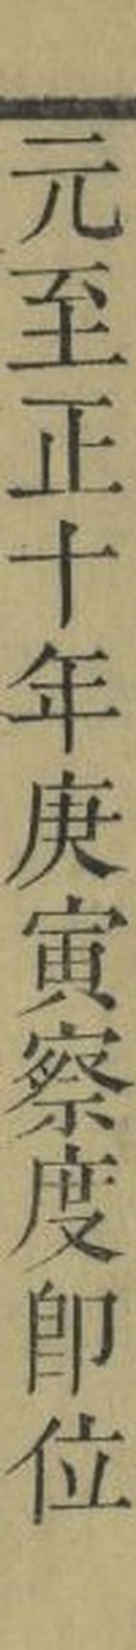元至正十年庚寅察度即位
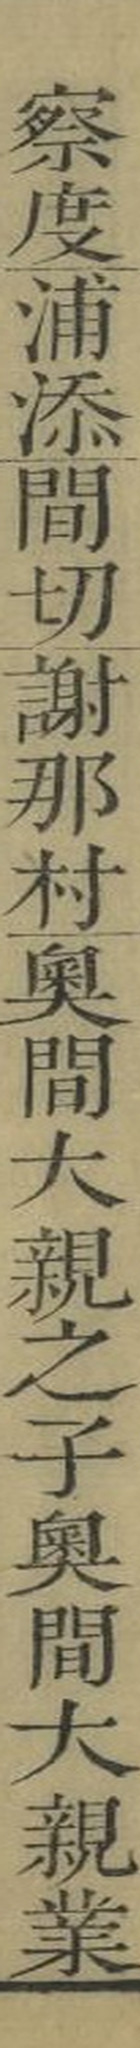察度[浦添]間切[謝那村]奥間大親之子奥間大親業
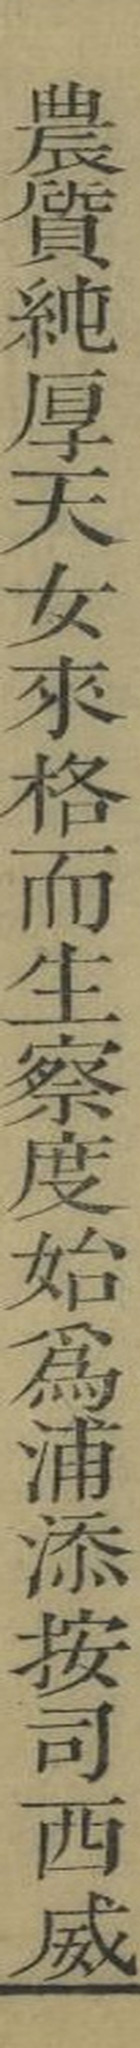農質純厚天女来格而生察度始為浦添按司西威
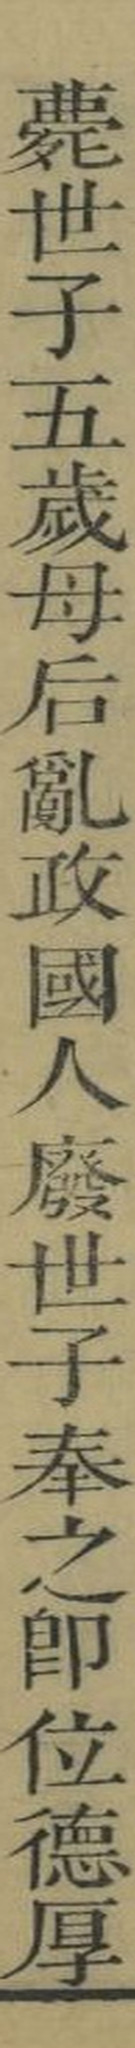薨世子五歳母后乱政国人廃世子奉之即位徳厚
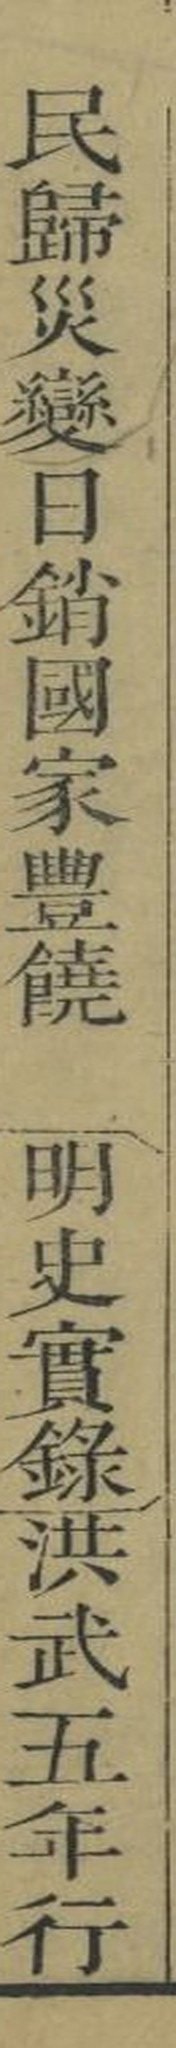民帰災変日銷国家豊饒[明史実録]洪武五年行
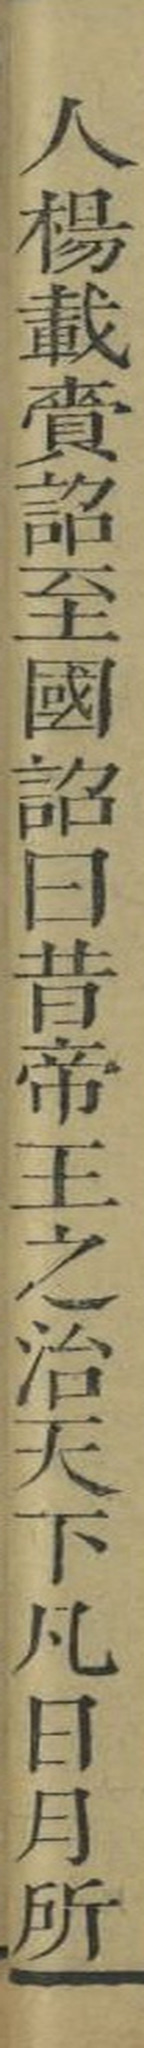人楊載賚詔至国詔曰昔帝王之治天下凡日月所
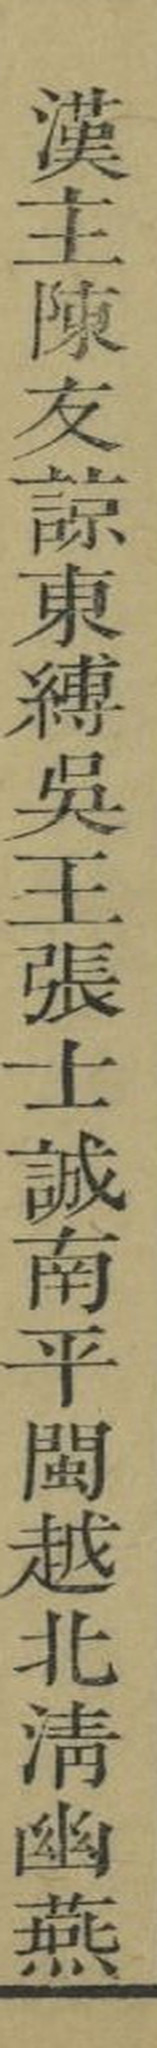漢主陳友諒東縛呉王張士誠南平閩越北清幽燕
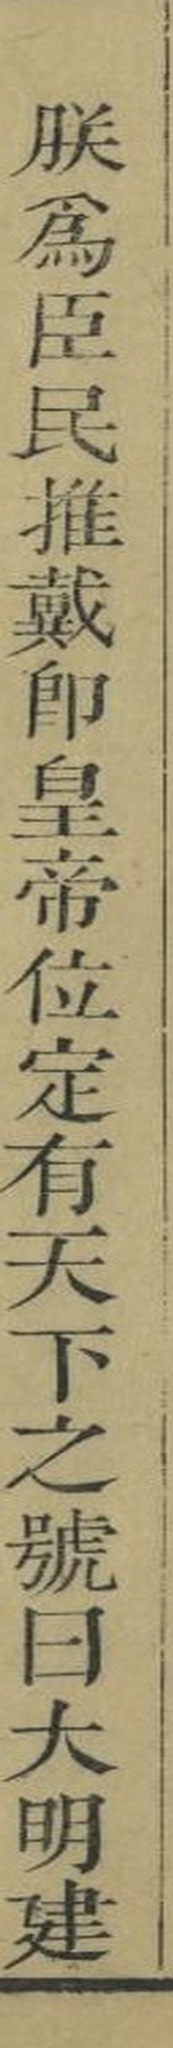朕為臣民推戴即皇帝位定有天下之号曰大明建
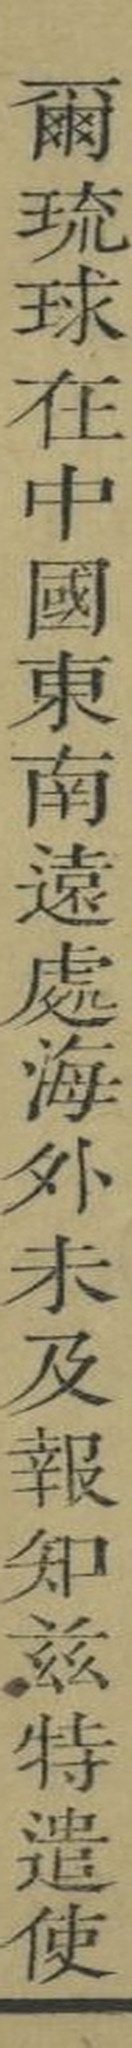爾琉球在中国東南遠処海外未及報知茲特遣使

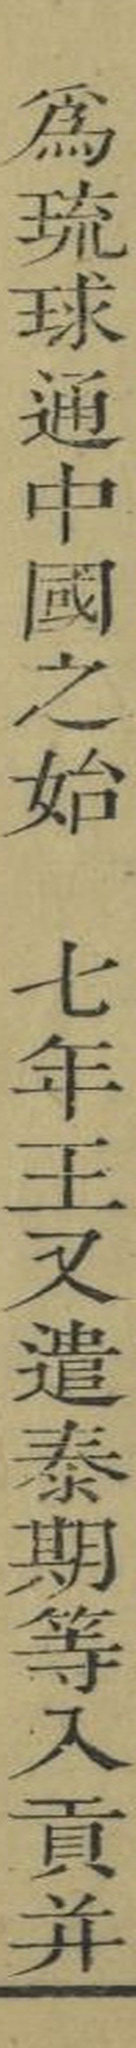為琉球通中国之始七年王又遣泰期等入貢并
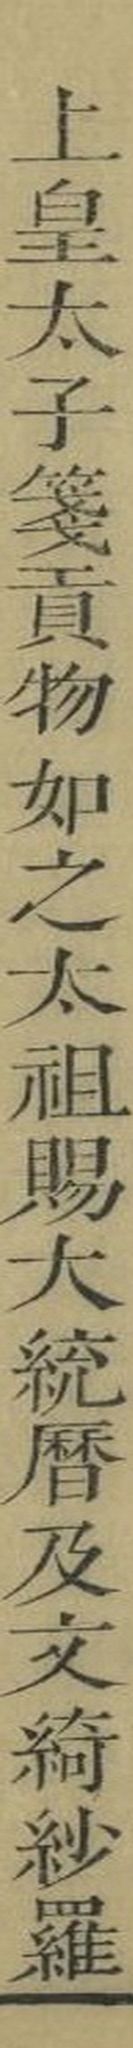上皇太子箋貢物如之太祖賜大統暦及文綺紗羅
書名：中山伝信録 巻三
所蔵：University of the Ryukyus Library
